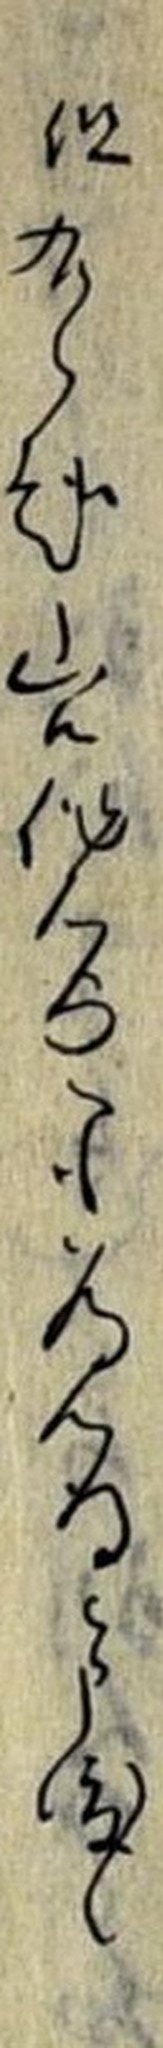但右之趣山口作右衛門へも為心得被申渡候
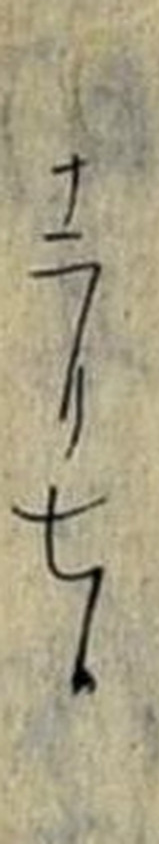十二月七日
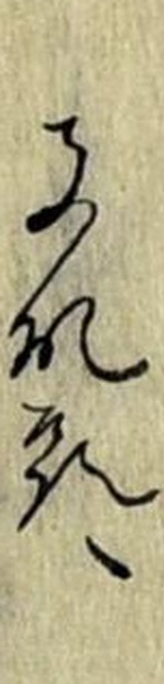支配頭へ
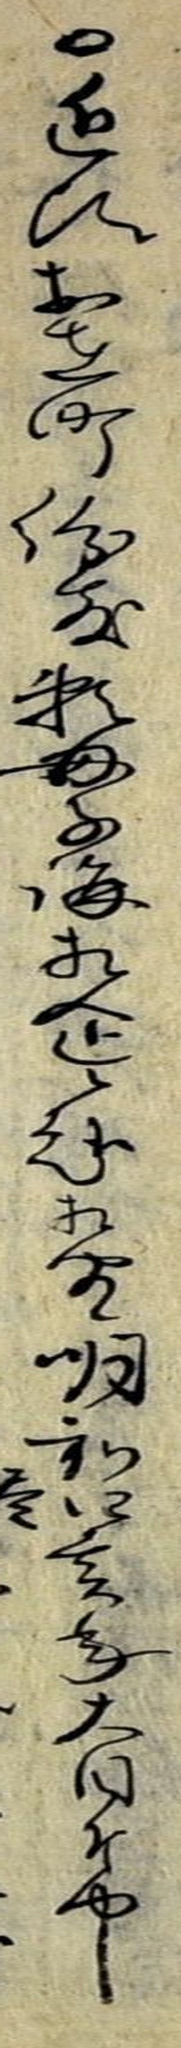〇近頃於在町紛敷頼母子講相企候趣相聞候明和四亥年大目付中
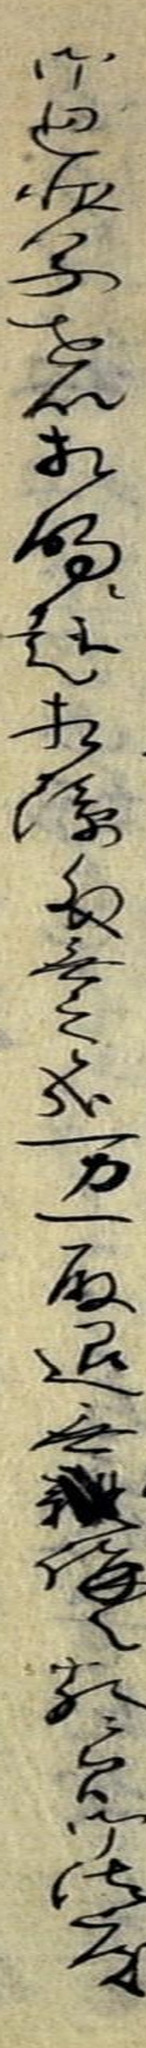御廻状写を以相触候趣相障義無之候哉万一取退無尽講之類ニ而ハ御法度
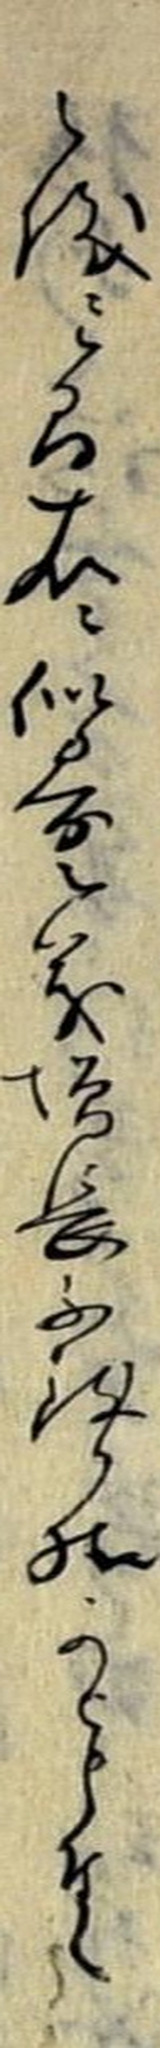之儀ニ候間右ニ似寄候義増長不致候様可被申付候
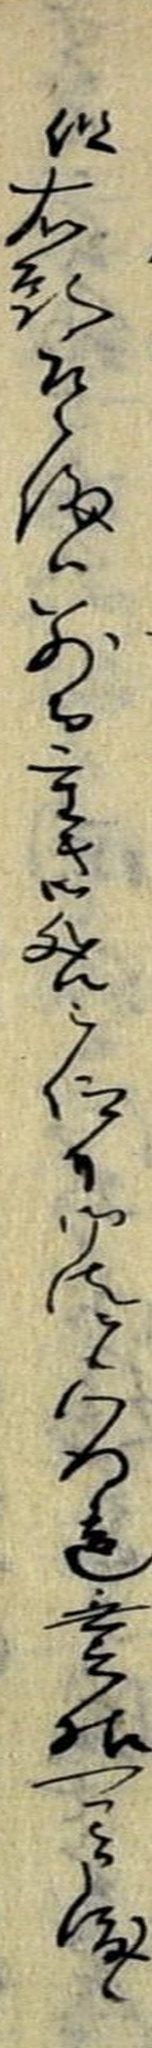但右頭取之儀ハ別而重キ御咎被仰付御法ニ候心得違無之様可被申渡候
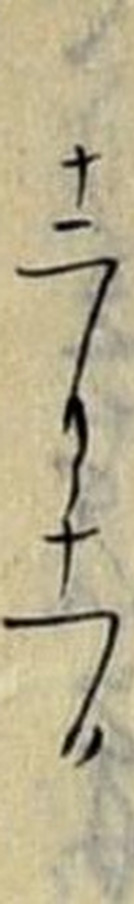十二月十一日
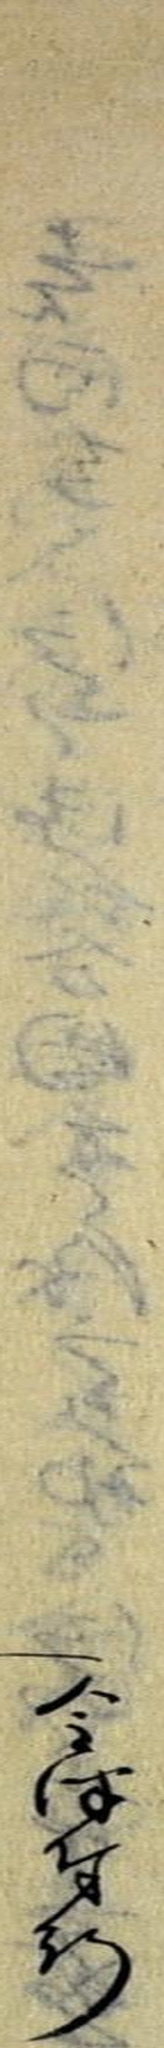金津奉行
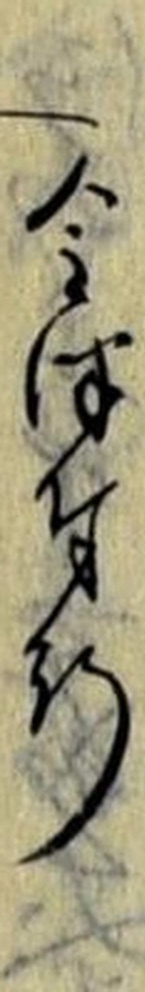金津奉行
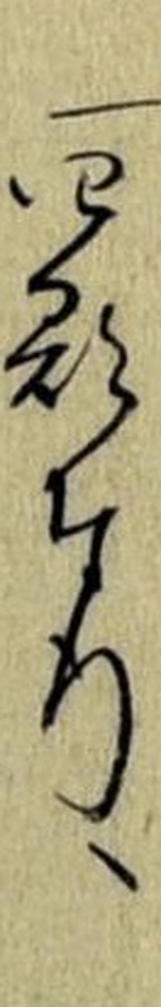四郡奉行へ
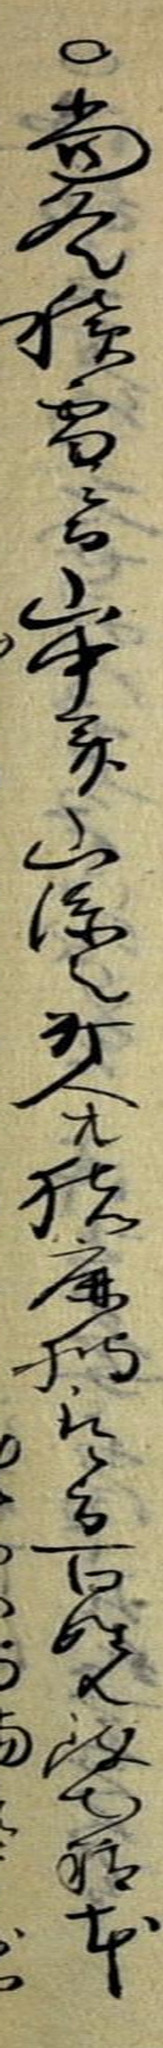〇当冬積雪ニ而山中并山添之村人共猪鹿狩取候旨百姓共致出精本
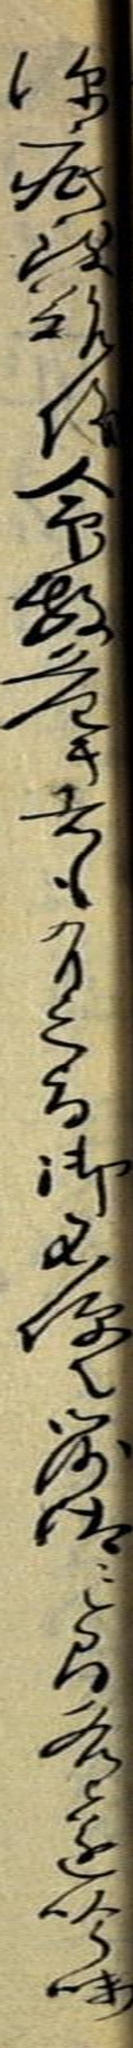深疵致難儀命数危キ者も有之旨御不便之御沙汰ニ候間各被遂吟味
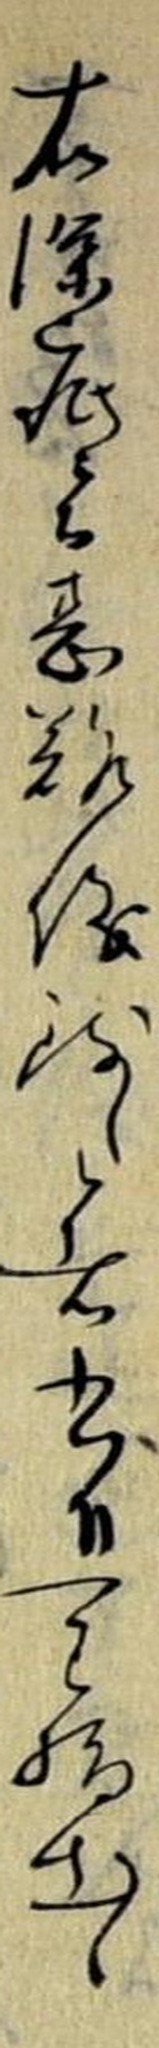右深疵ニ而甚難儀致し候者書付可被指出候

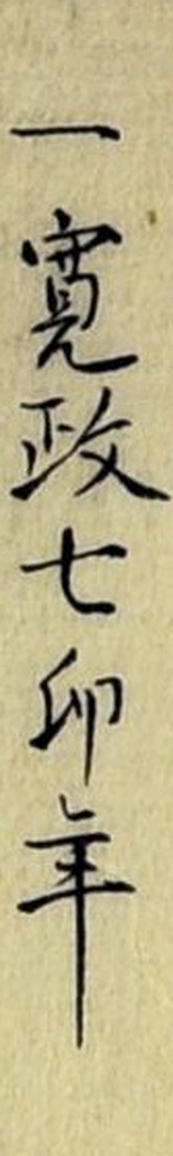一寛政七卯年
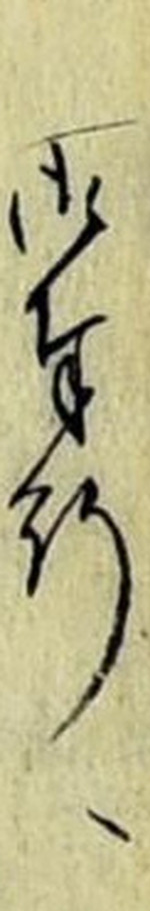御奉行へ
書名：命令之部 三
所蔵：福井県文書館 Fukui Prefectural Archives
